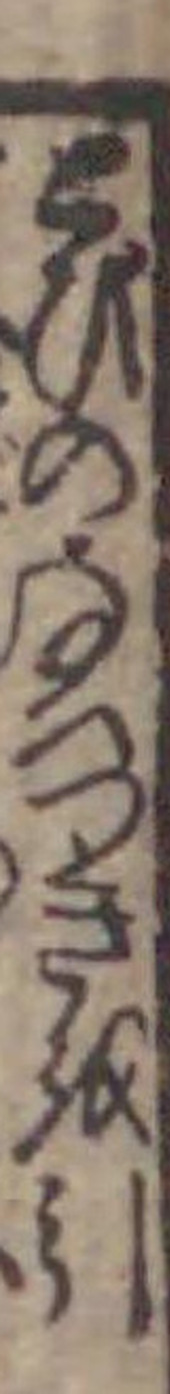とびのなはつきを引
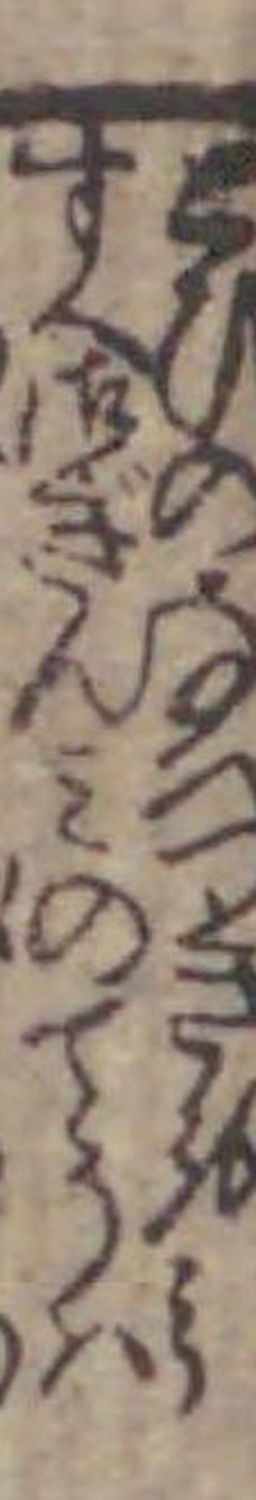すへ御ぎんみのてうは
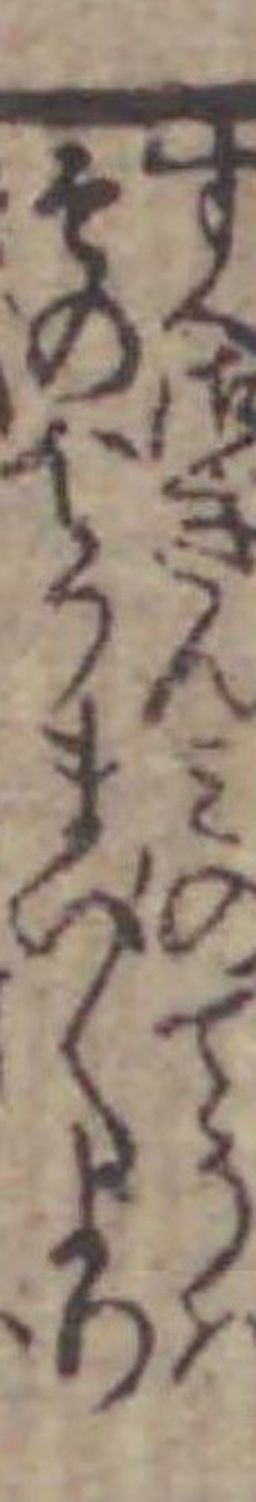そのほうまい〳〵より
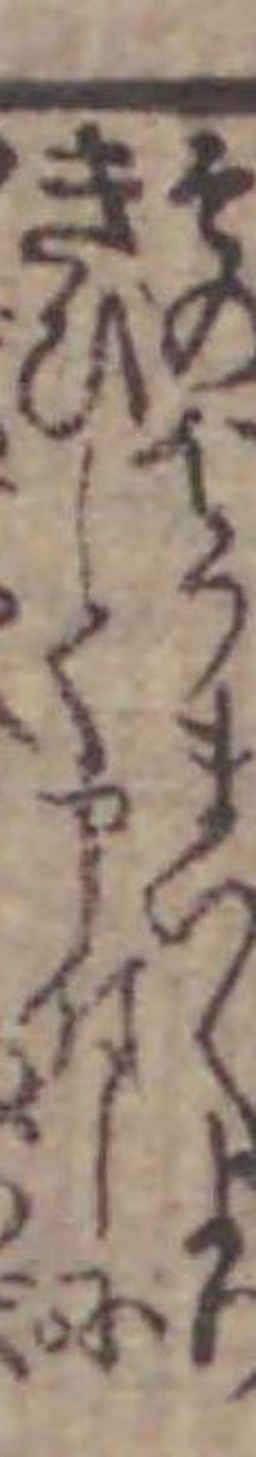きびしく申付しに
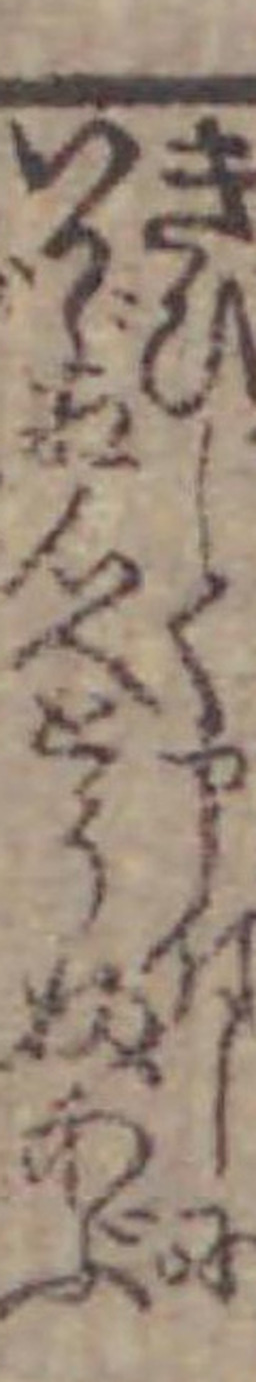いかゞ相心へとうふあぶ
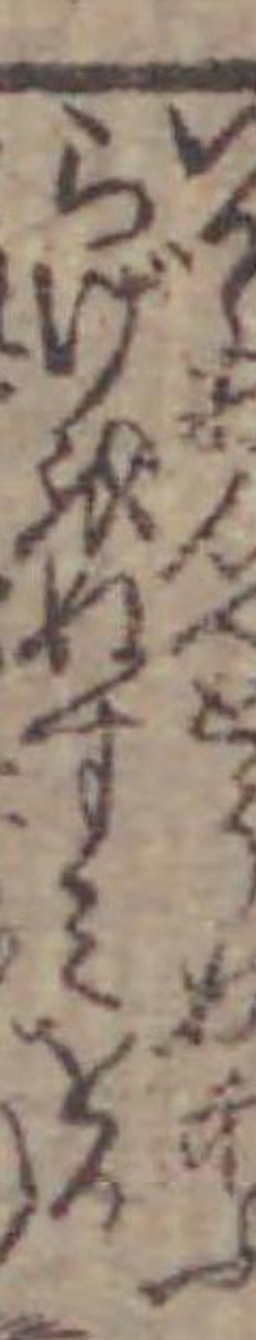らげをぬすみをる
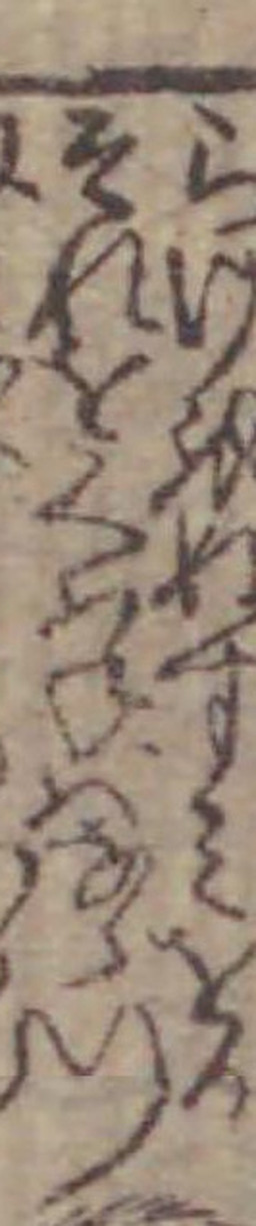それをくはねばなら
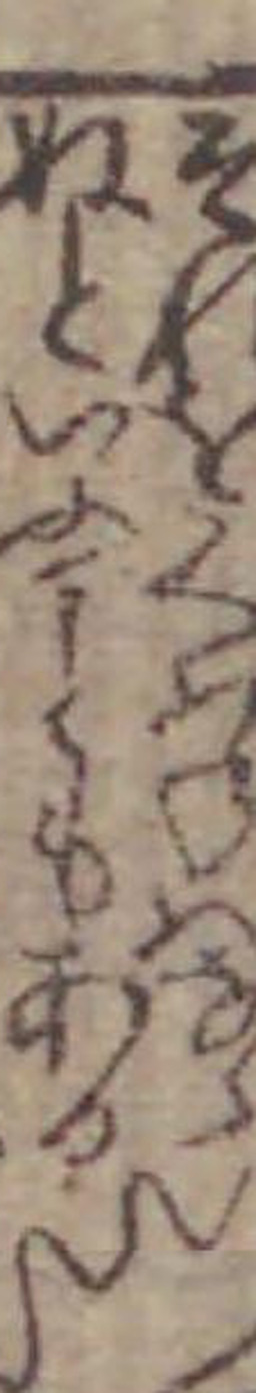ぬといふこともある
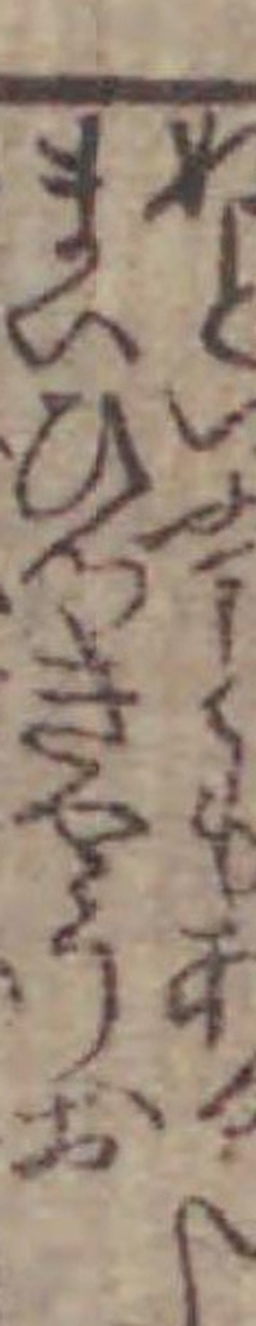まいひつきやうお
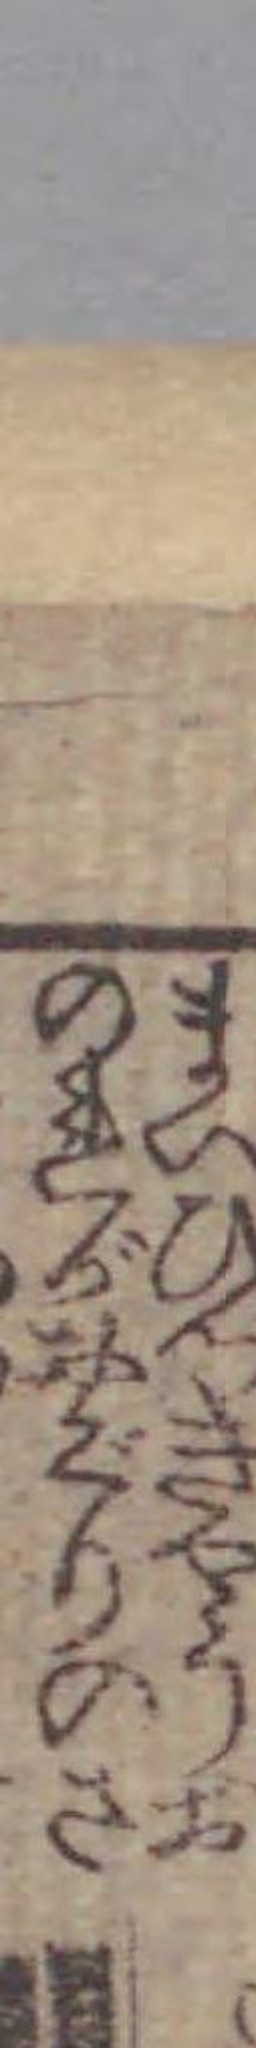のれがおごりのさ
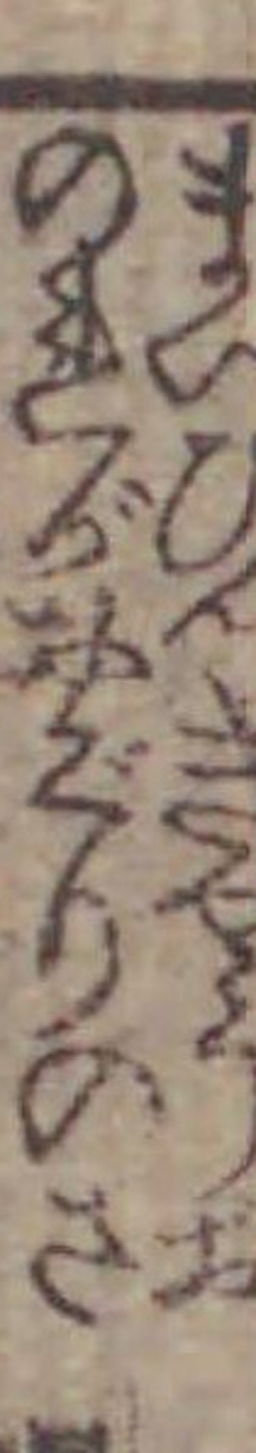のれがおごりのさ
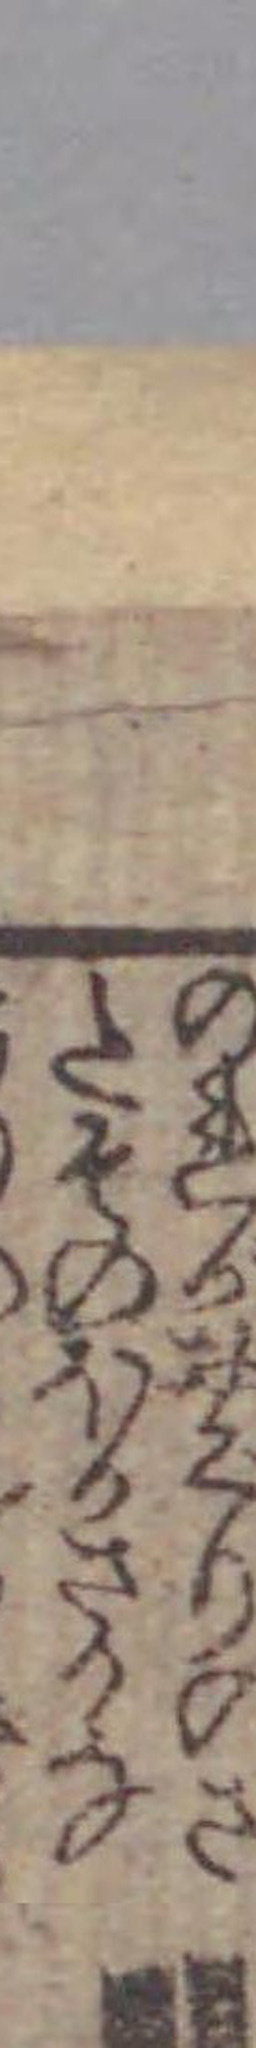たそのほかさかな
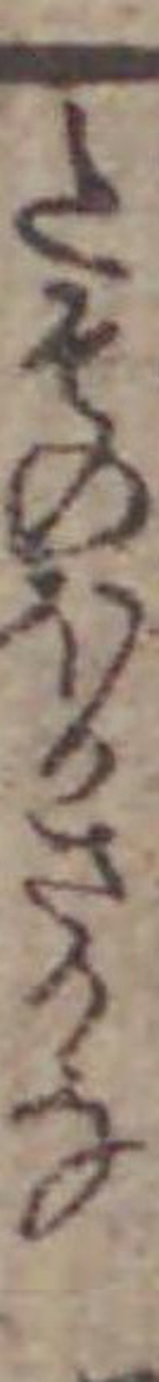たそのほかさかな
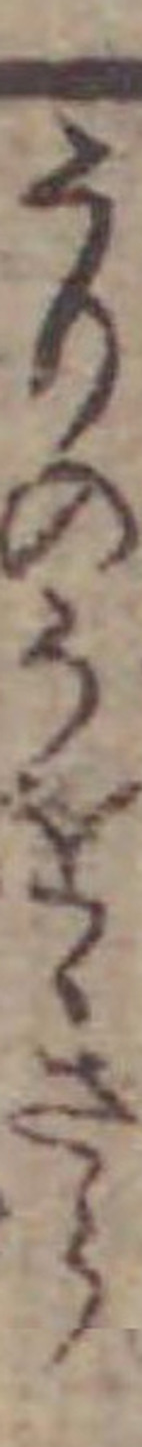うりのうをゝさら
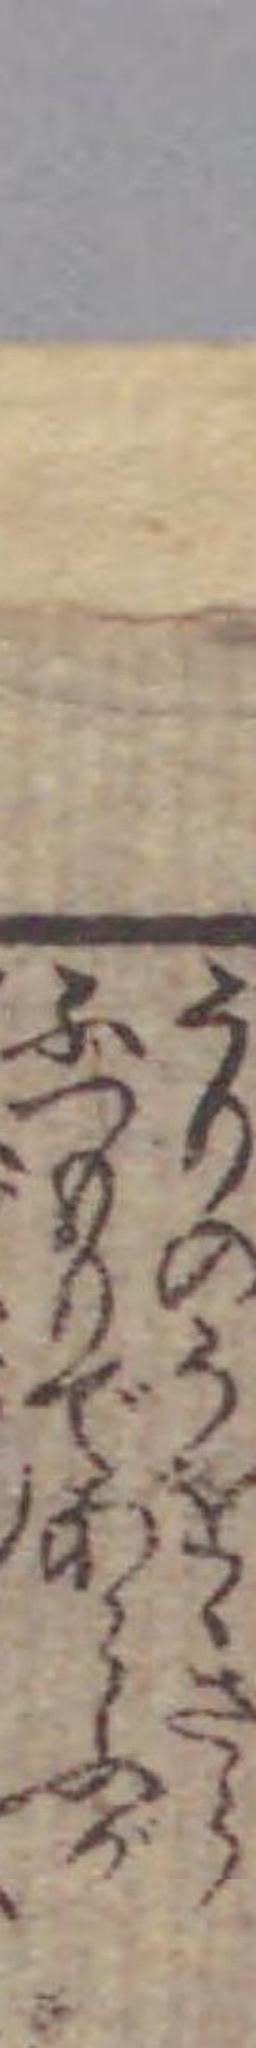ふつもりであらふが
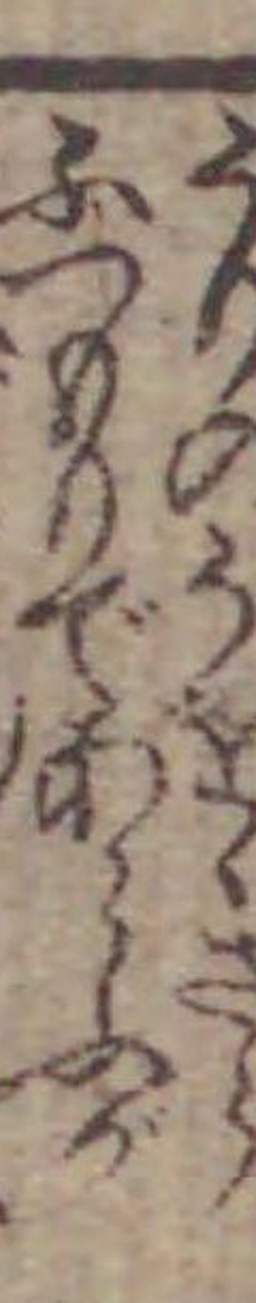ふつもりであらふが
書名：即席耳学問 : 3巻
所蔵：国立国会図書館 National Diet Library, JAPAN
